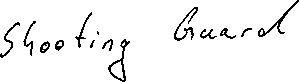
Shooting Guard
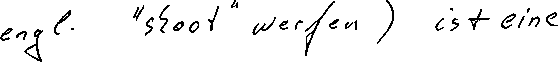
engl. "shoot" werfen) ist eine
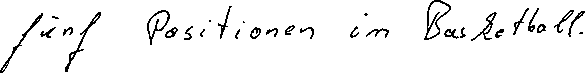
fünf Positionen im Basketball.
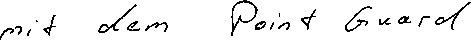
mit dem Point Guard
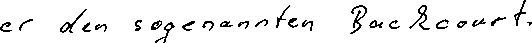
er den sogenannten Backcourt.
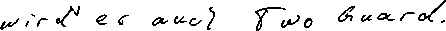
wird er auch Two Guard,
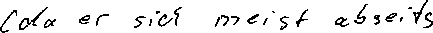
(da er sich meist abseits,
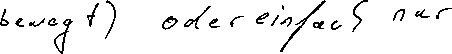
bewegt), oder einfach nur
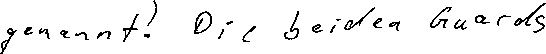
genannt. Die beiden Guards
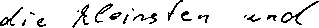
die kleinsten und
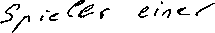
Spieler einer
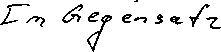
Im Gegensatz
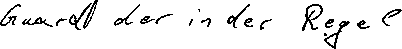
Guard, der in der Regel
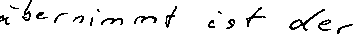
übernimmt, ist der
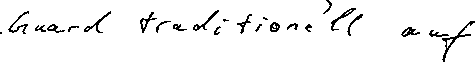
Guard traditionell auf
